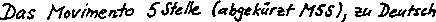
Das Movimento 5 Stelle (abgekürzt M5S), zu Deutsch
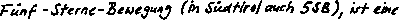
Fünf-Sterne-Bewegung (in Südtirol auch 5SB), ist eine
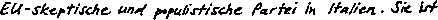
EU-skeptische und populistische Partei in Italien. Sie ist
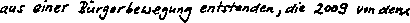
aus einer Bürgerbewegung entstanden, die 2009 von dem
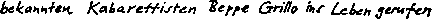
bekannten Kabarettisten Beppe Grillo ins Leben gerufen
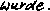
wurde.
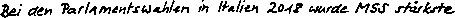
Bei den Parlamentswahlen in Italien 2018 wurde M5S stärkste
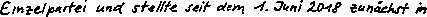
Einzelpartei und stellte seit dem 1. Juni 2018 zunächst in
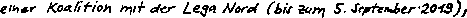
einer Koalition mit der Lega Nord (bis zum 5. September 2019),
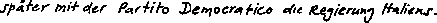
später mit der Partito Democratico die Regierung Italiens.
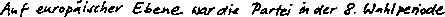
Auf europäischer Ebene war die Partei in der 8. Wahlperiode
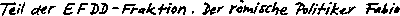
Teil der EFDD-Fraktion. Der römische Politiker Fabio
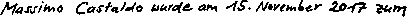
Massimo Castaldo wurde am 15. November 2017 zum
